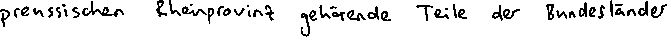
preußischen Rheinprovinz gehörende Teile der Bundesländer
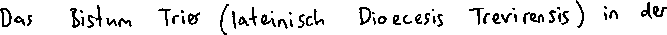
Das Bistum Trier (lateinisch Dioecesis Trevirensis) in der
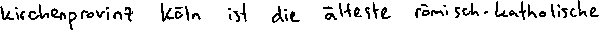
Kirchenprovinz Köln ist die älteste römisch-katholische
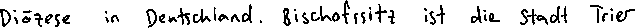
Diözese in Deutschland. Bischofssitz ist die Stadt Trier
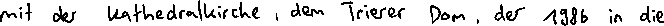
mit der Kathedralkirche, dem Trierer Dom, der 1986 in die
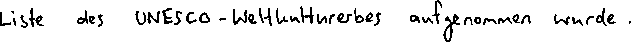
Liste des UNESCO-Weltkulturerbes aufgenommen wurde.
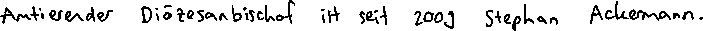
Amtierender Diözesanbischof ist seit 2009 Stephan Ackermann.
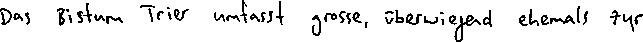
Das Bistum Trier umfasst große, überwiegend ehemals zur
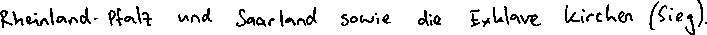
Rheinland-Pfalz und Saarland sowie die Exklave Kirchen (Sieg).
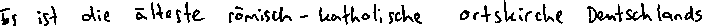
Es ist die älteste römisch-katholische Ortskirche Deutschlands
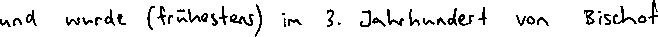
und wurde (frühestens) im 3. Jahrhundert von Bischof
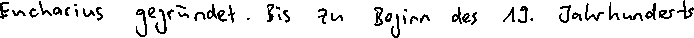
Eucharius gegründet. Bis zu Beginn des 19. Jahrhunderts
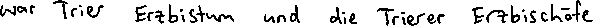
war Trier Erzbistum und die Trierer Erzbischöfe
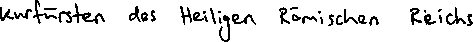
Kurfürsten des Heiligen Römischen Reichs.
